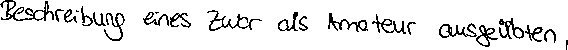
Beschreibung einer zwar als Amateur ausgeübten,
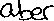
aber
